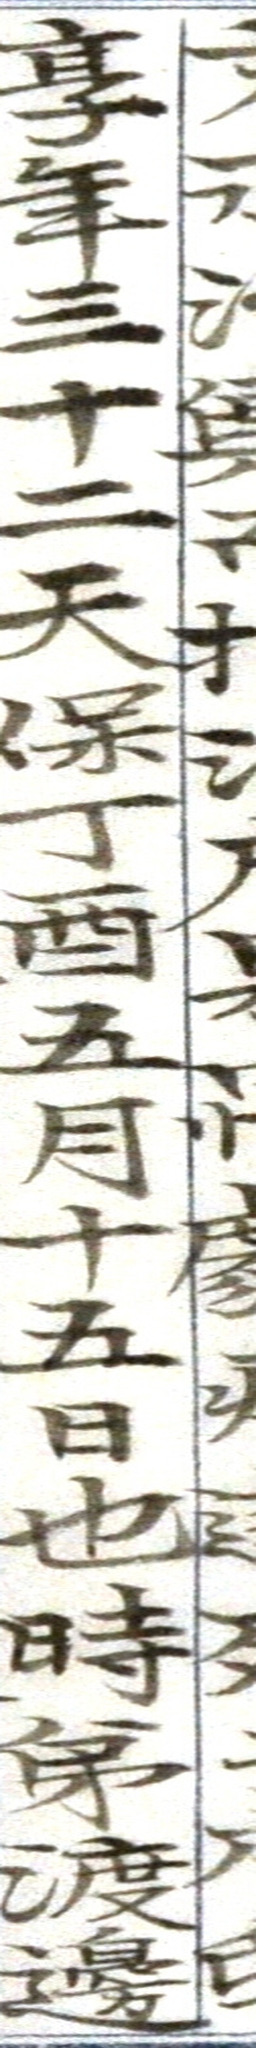享年三十二天保丁酉五月十五日也時第渡邊
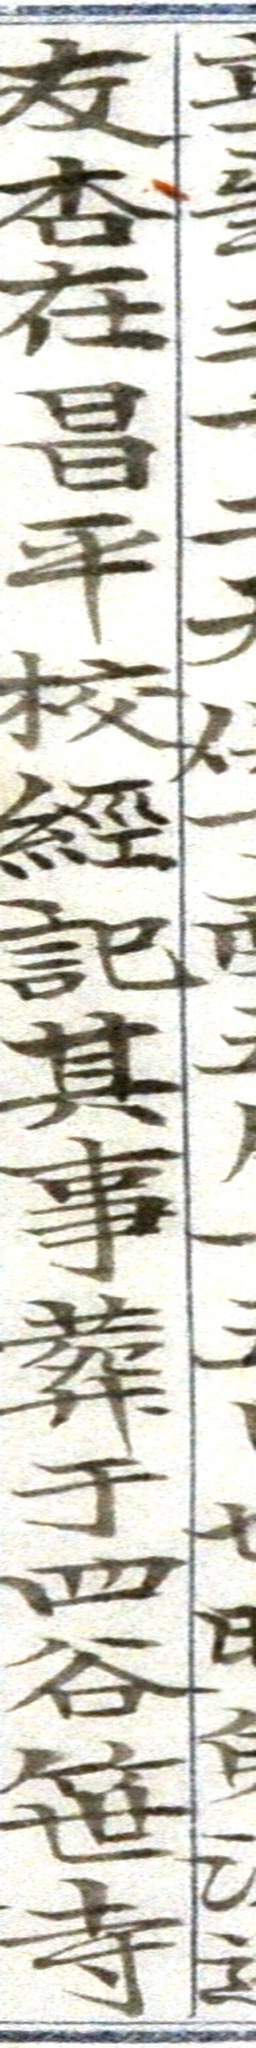友杏在昌平校経記其事葬于四谷笹寺
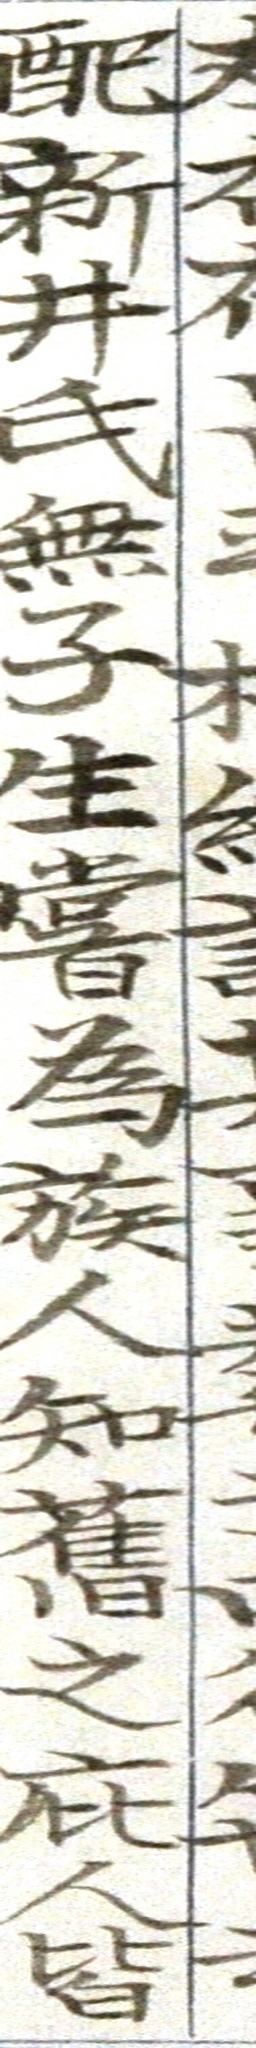配新井氏無子生嘗為族人知旧之庇人皆
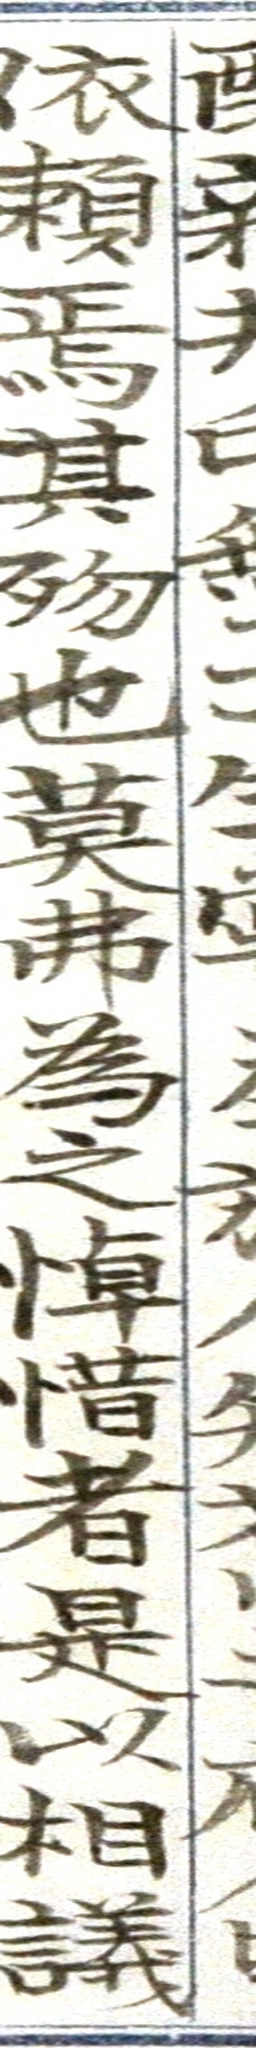依頼焉其歾也莫弗為之悼惜者是以相議
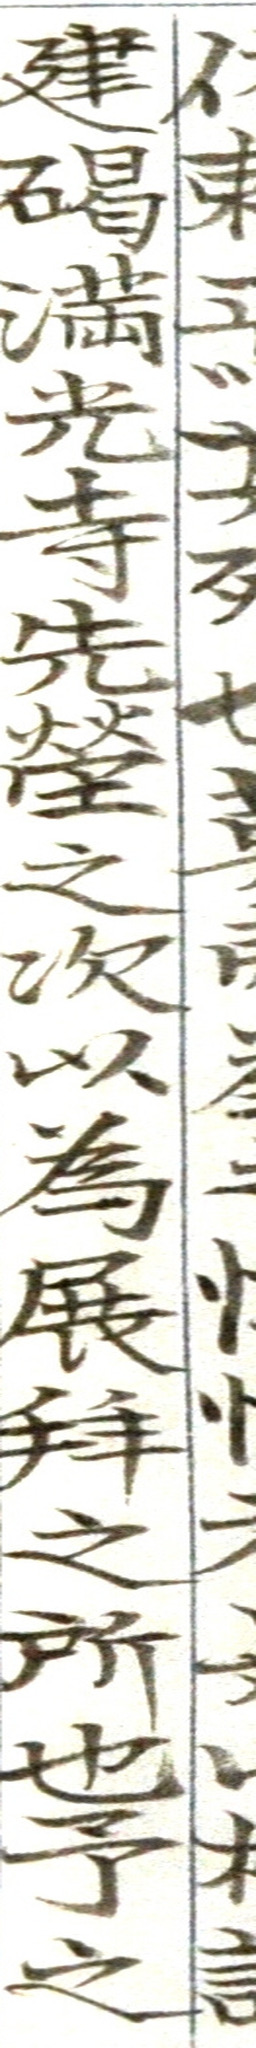建碣満光寺先塋之次以為展拝之所也予之

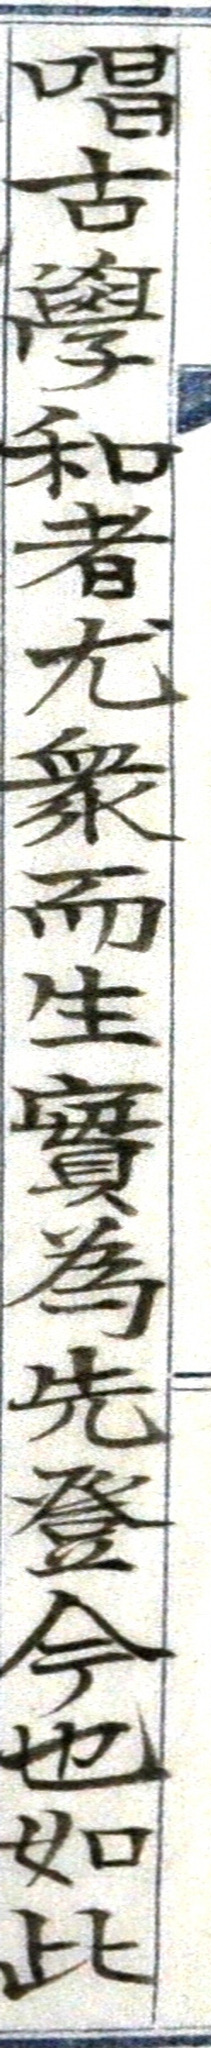唱古学和者尤衆而生実為先登今也如此
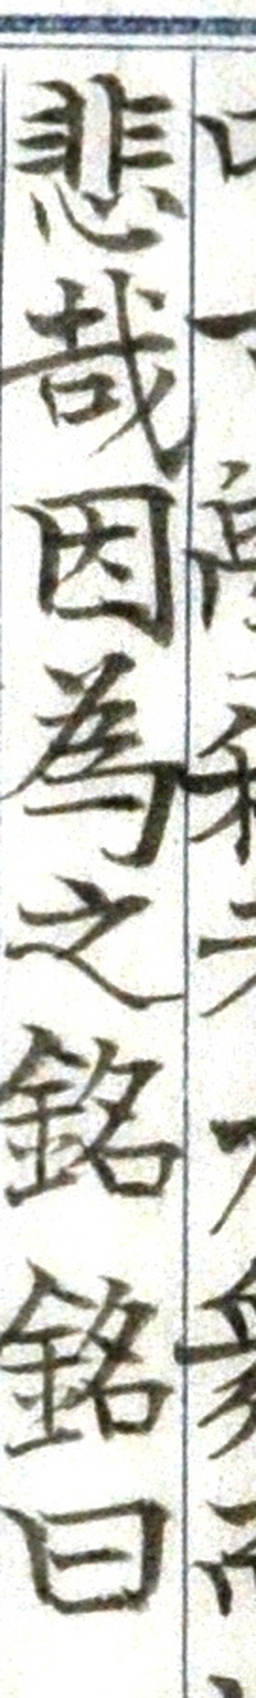悲哉因為之銘銘曰
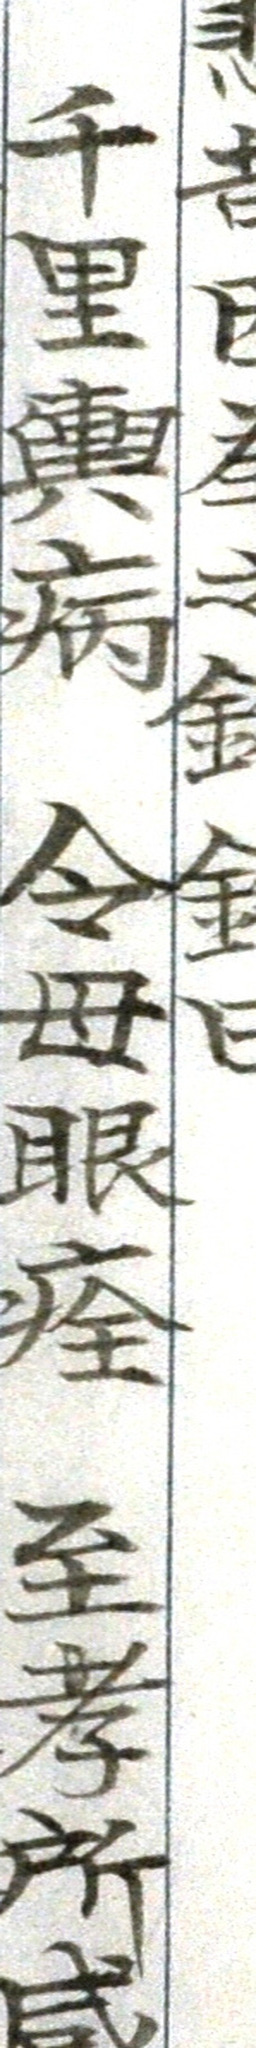千里興病令母眼痊至孝所感
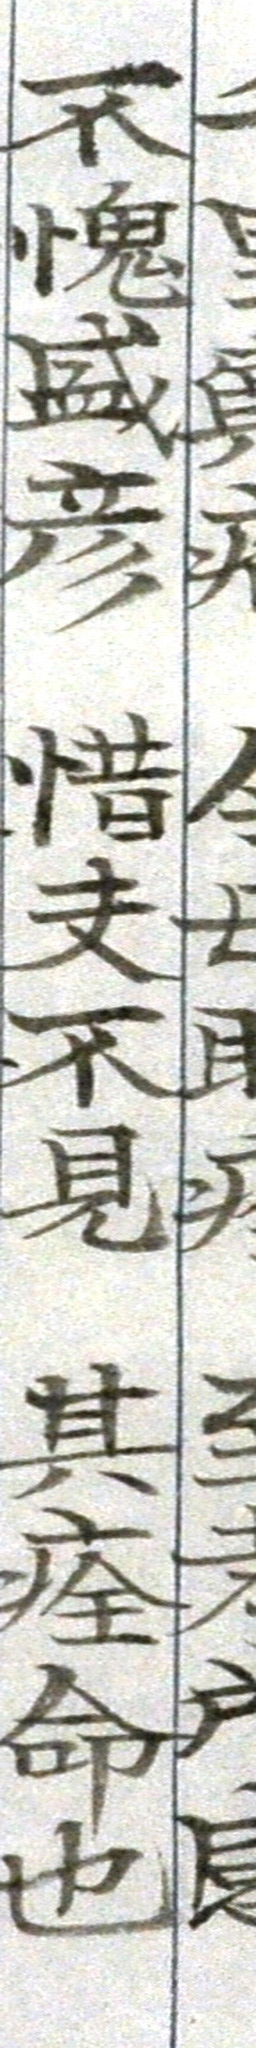不愧盛彦惜夫不見其痊命也
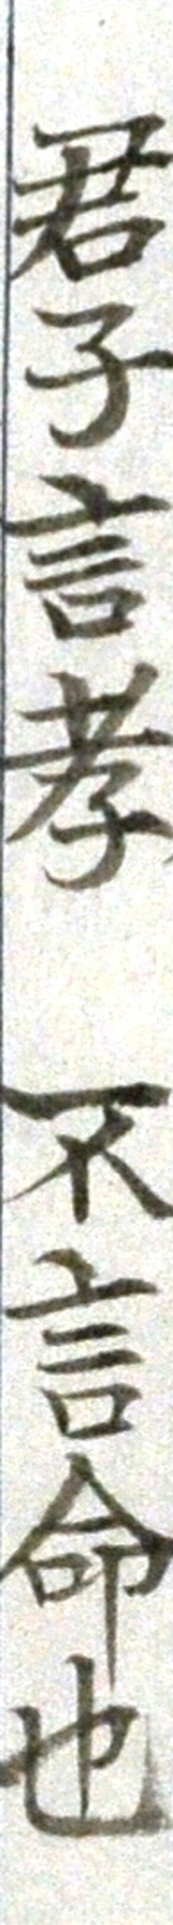君子言孝不言命也
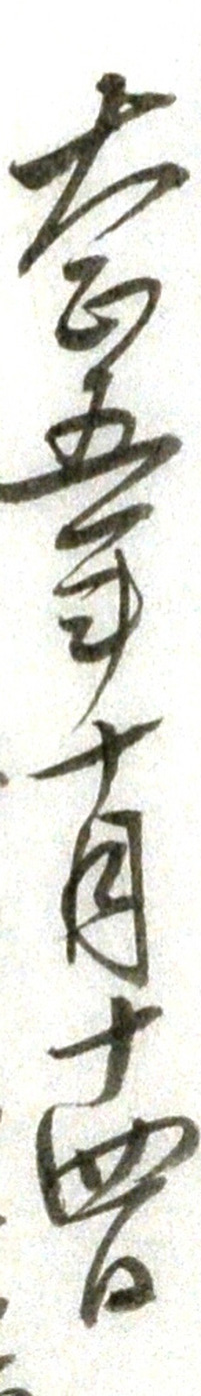大正五年十月十四日
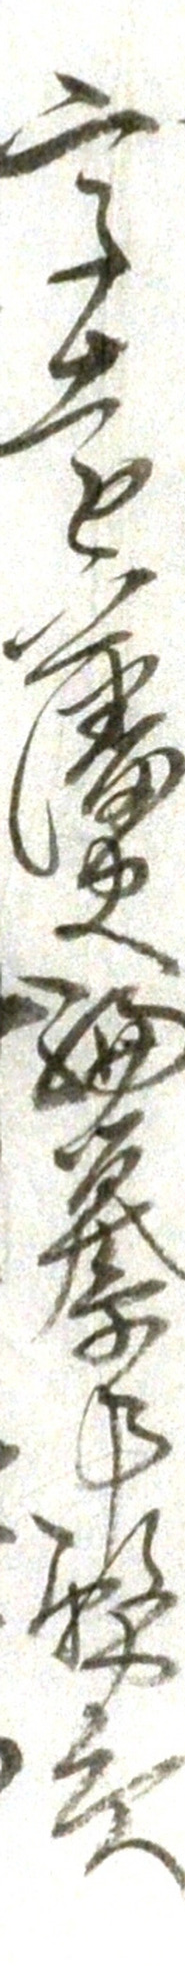高遠藩史編纂事務員
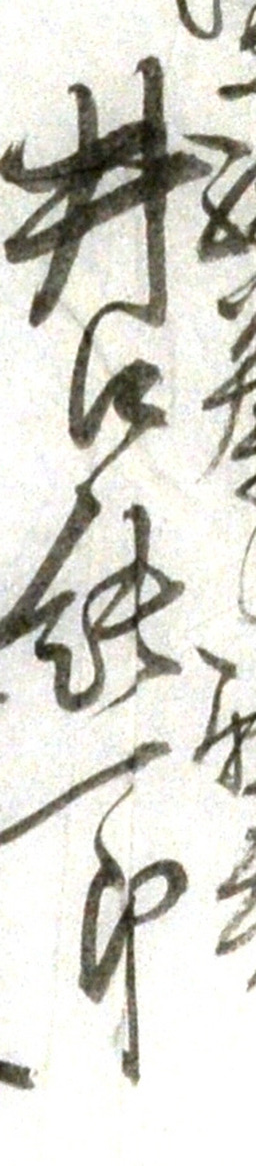井上純一郎
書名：阿左見帰睡翁・佐藤薫谷先生碑文
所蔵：伊那市立高遠町図書館・合同会社AMANE
